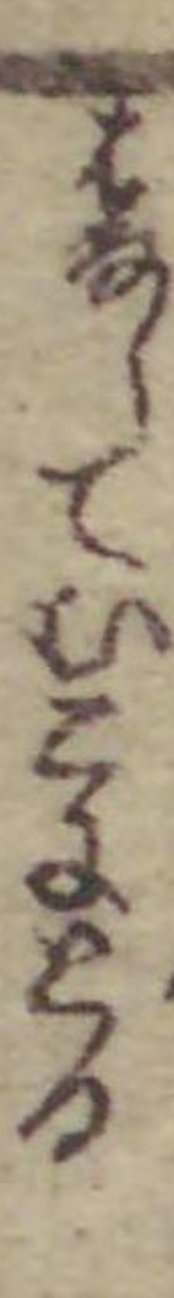はなしてむこにとる
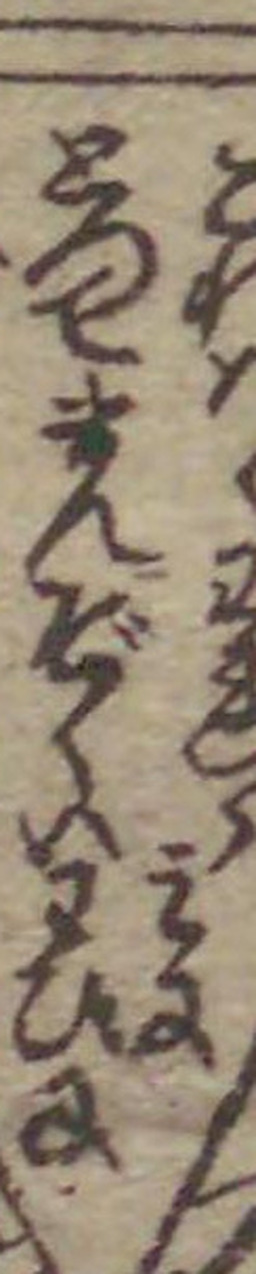とつてまんぞくいわひに
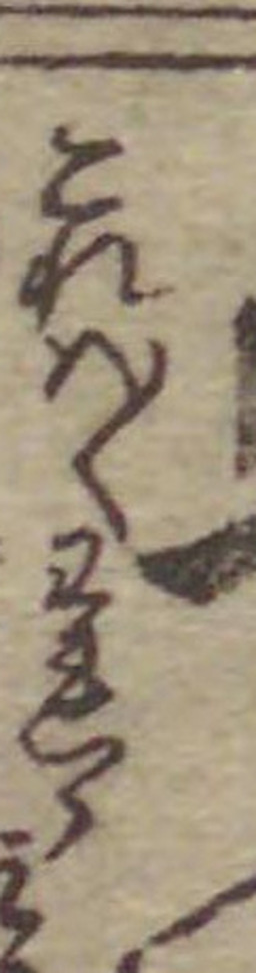これは〳〵われらみに
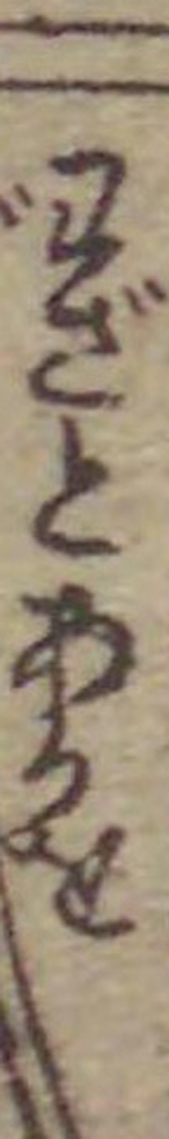わざとあかを
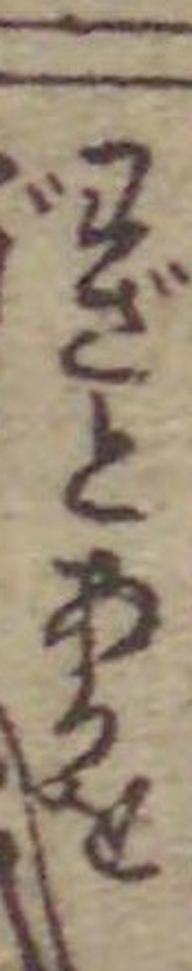わざとあかを
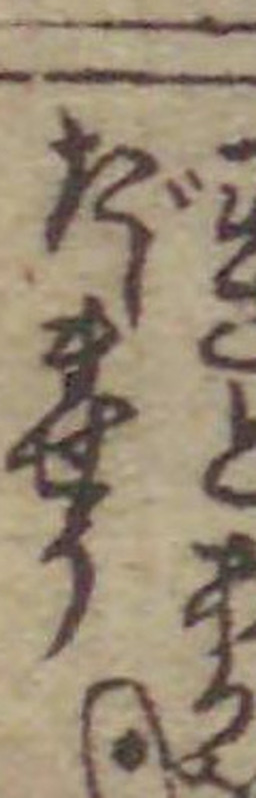だしませう

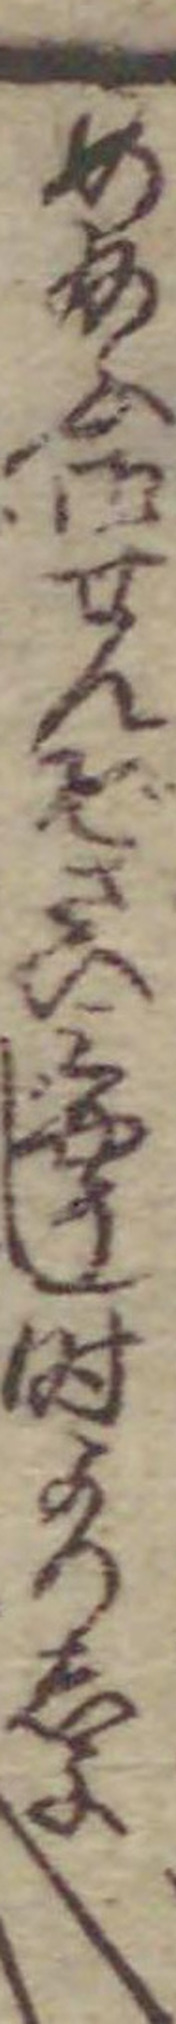め給ふ御せんぞさいみやうじ時よりしよ
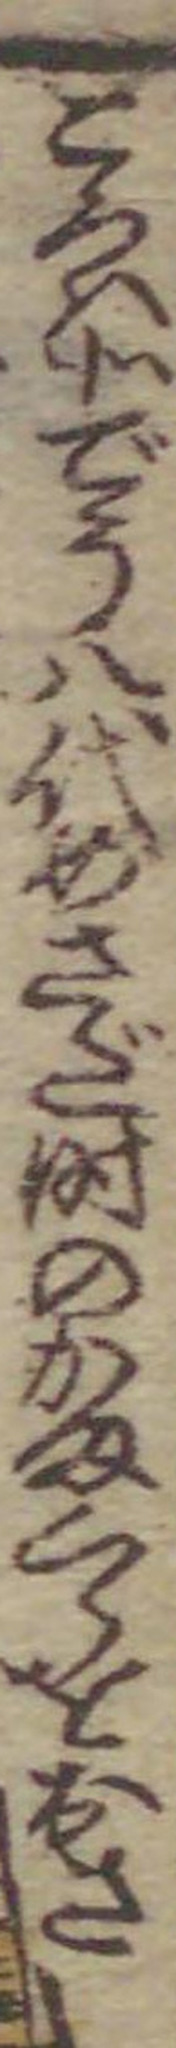ころは北でう八代めさだ時のかまくらをおさ
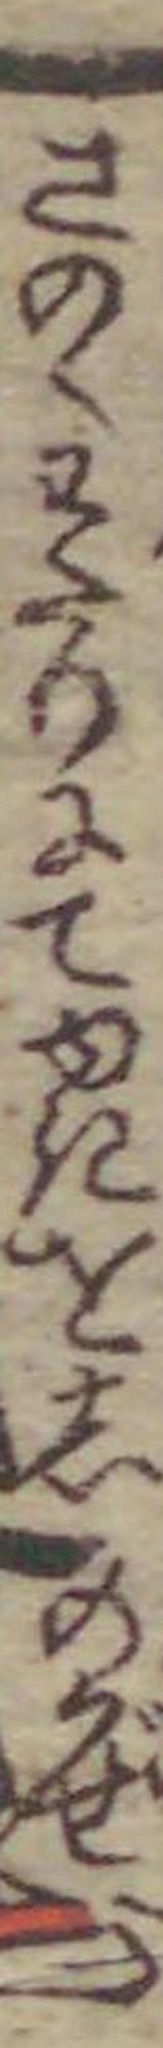さのゝわたりにてゆきをしのがせ
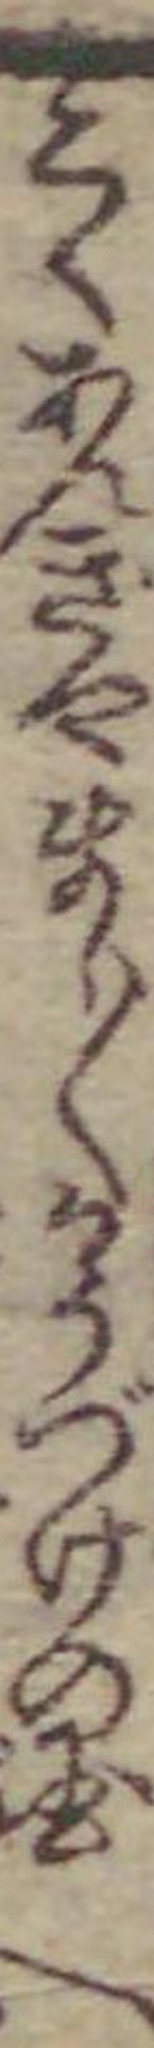こくあんぎやまし〳〵かうづけの国
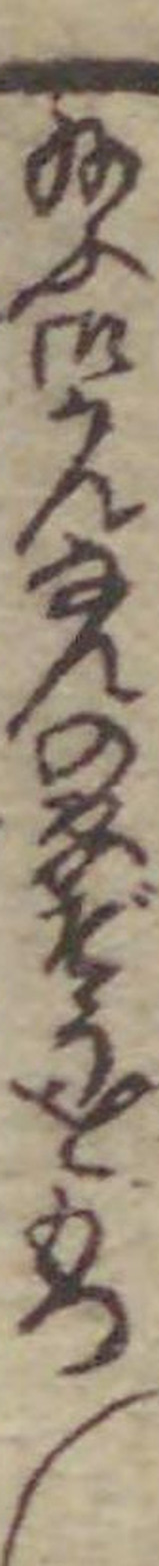給ふ御かんなんのゑぞうをもつ
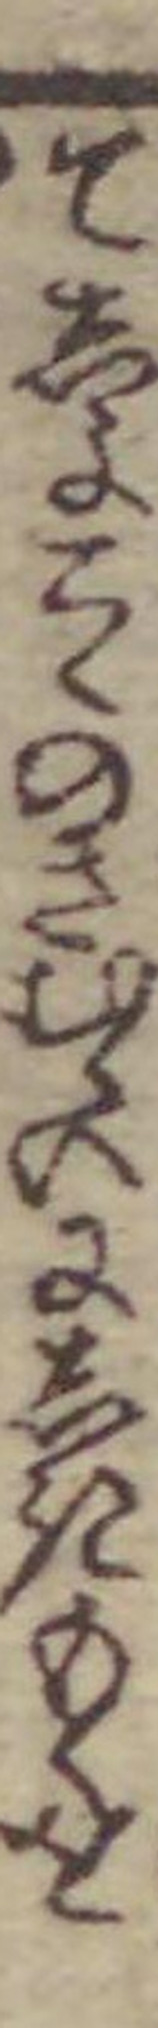てしよこくのさむらいにしきもくを
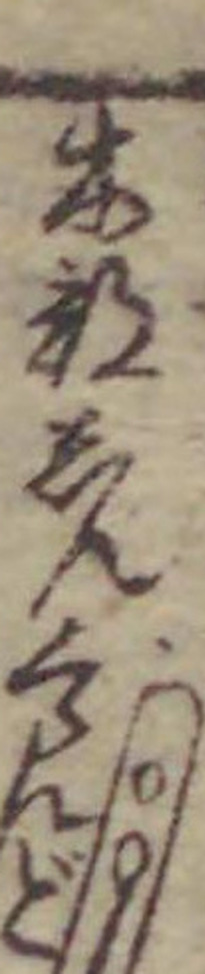木部しんくらんど
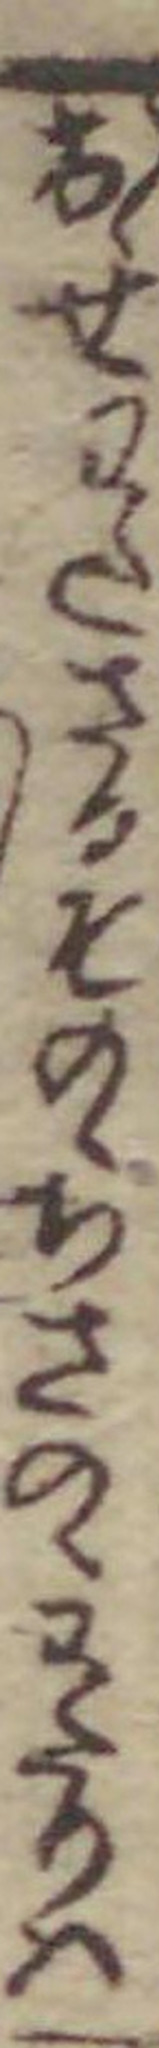おゝせわたさるそのゝちさのゝわたりは
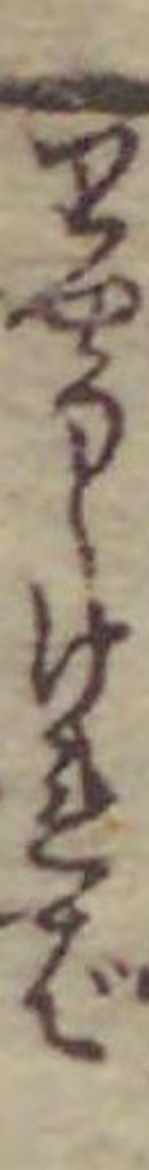りやうしければ
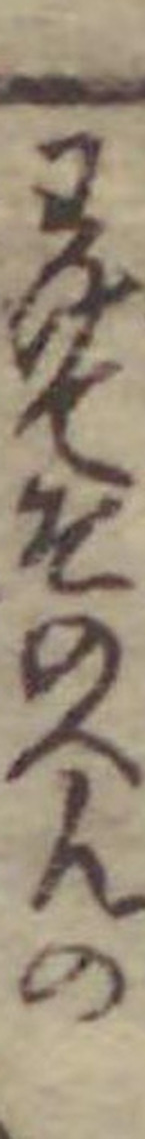わけてそのへんの
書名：娜二代鉢木 5巻
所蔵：国立国会図書館 National Diet Library, JAPAN
